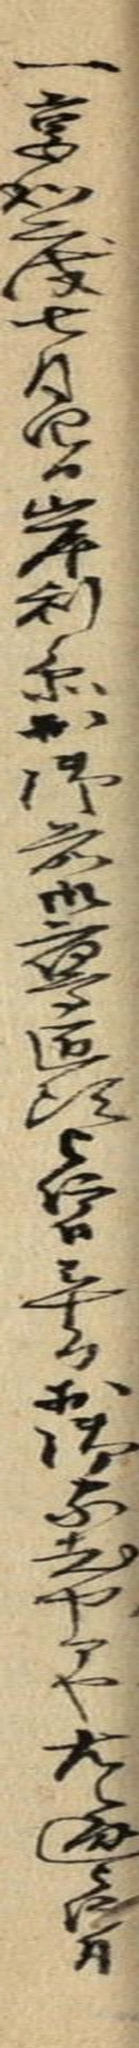一享和二戌七月四日岸利兵衛於御前御鷹匠頭被仰付畢而於御家老中部や左之通被仰付
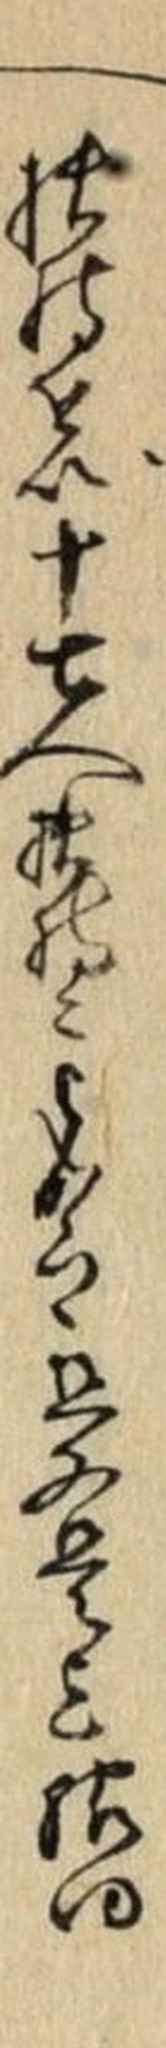扶持を以十七人扶持に被成下候且又是迄脇田
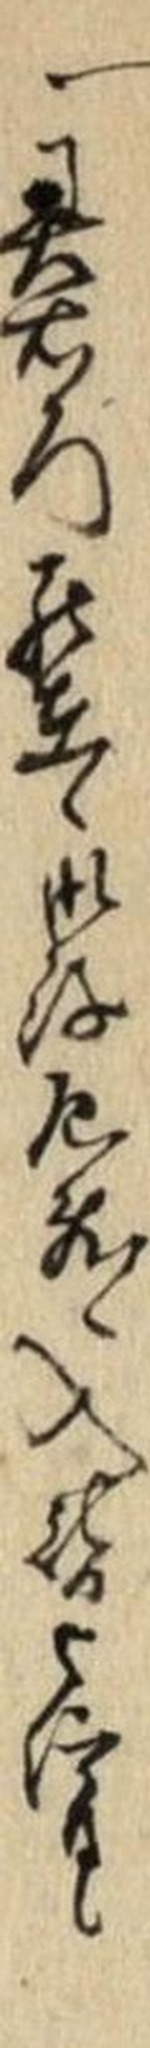奥右衛門罷在候御役屋敷へ入替被仰付候
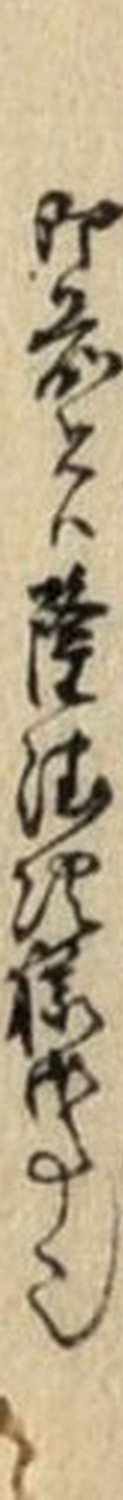御前とは隆徳院様御事也
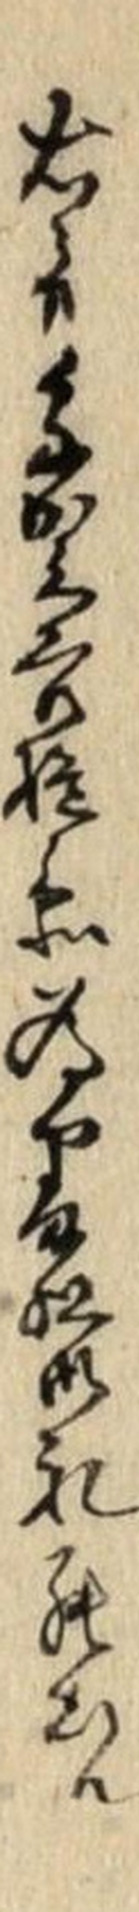右ニ付多賀谷権兵衛為番組御礼罷出ル
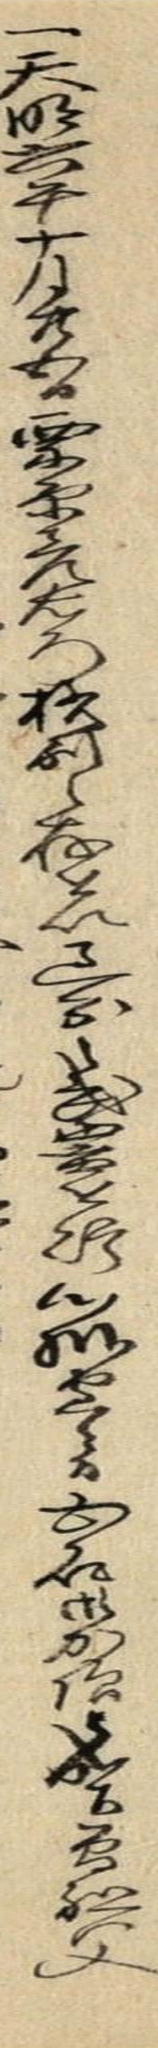一天明六午十月廿五日栗原彦右衛門格別之存を以過分之武器を貯心掛宜に付五石御加増被成下曽祖父
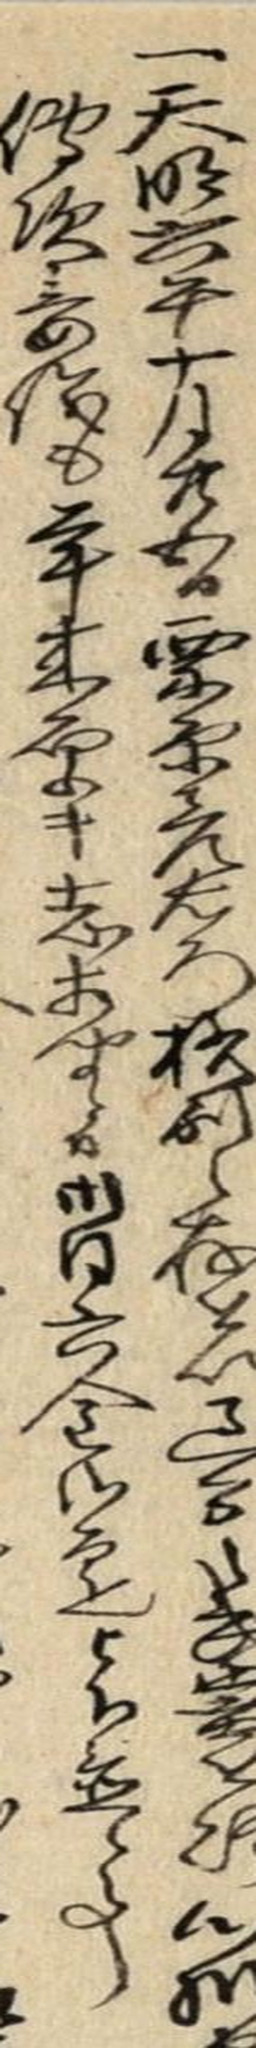伝次寄儀も年来厚き志相聞候付御目六金弐百疋被下置候事
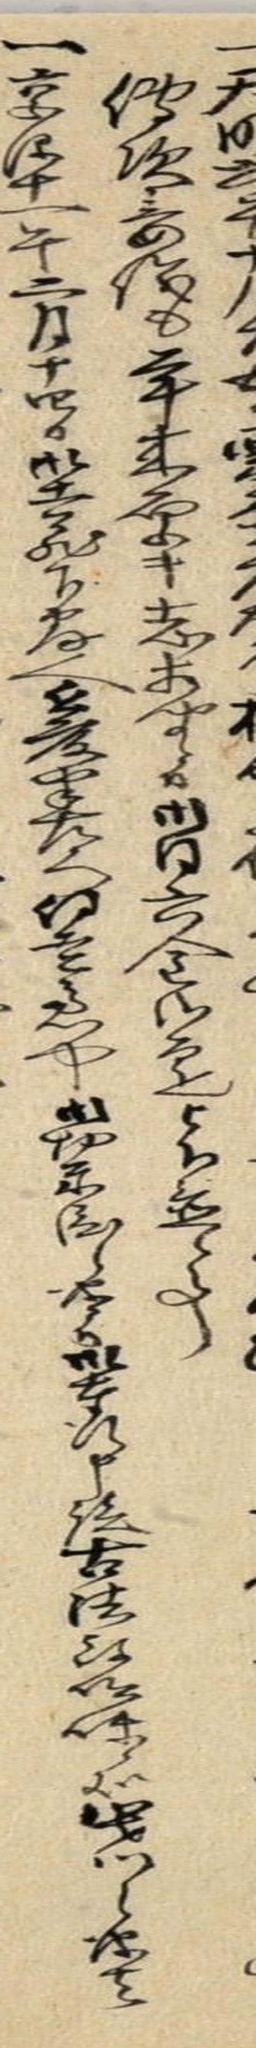一享保十一午二月十四日御土蔵下番人近藤半左衛門伺遠慮中御切米渡候儀に付御奉行申談古法致吟味候処閉門之儀は
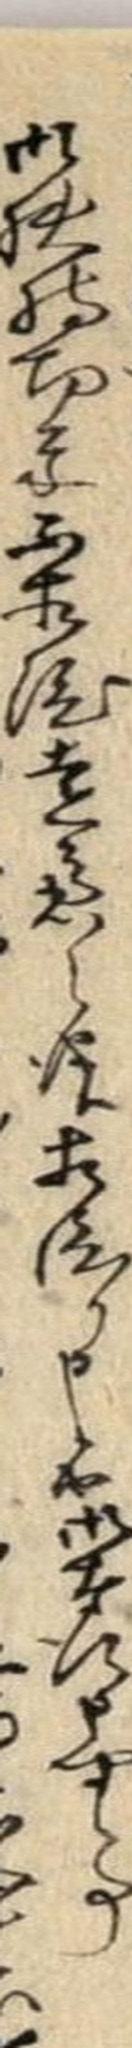御扶持切米不相渡遠慮之儀は相渡り申候由御奉行申聞候事
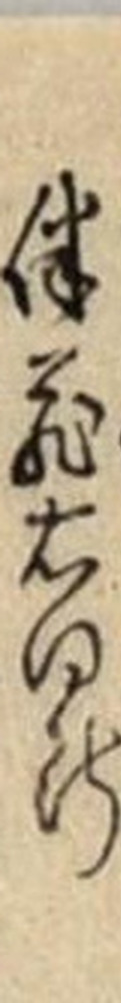伴蔵右同断
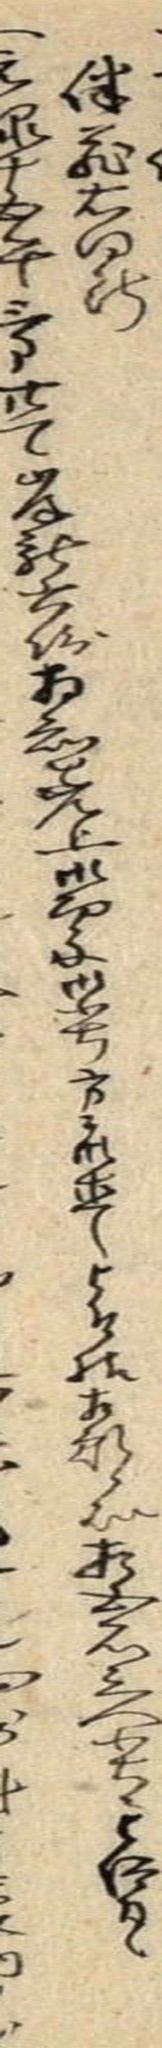一元禄十五午三月廿一日岸新六儀拝知差上御切米御ふち方に御直し被下候様相願候処拾五石三人ふち被仰付候
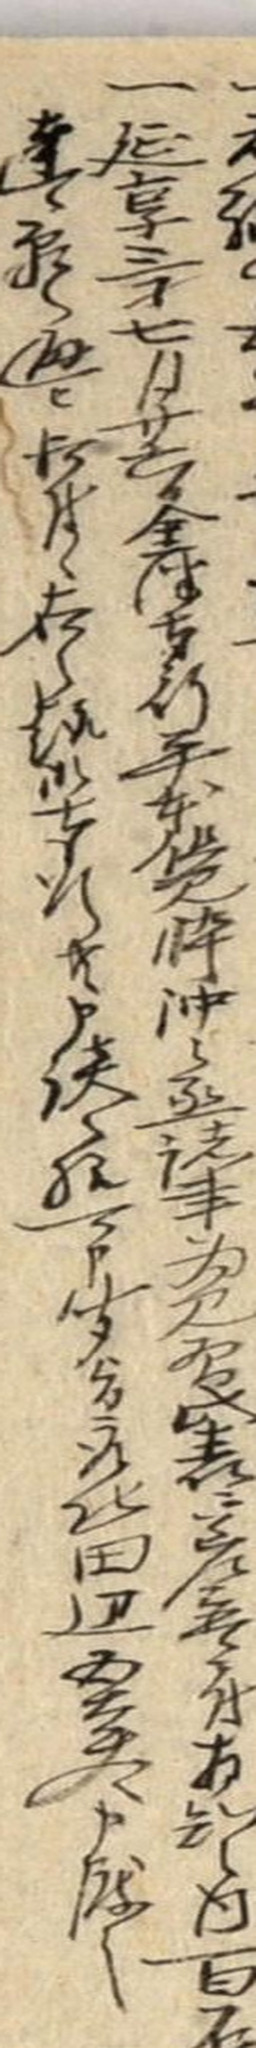達候願之通被仰付候右之趣奉行共申談候様可申聞旨取次田辺五太夫へ申渡之
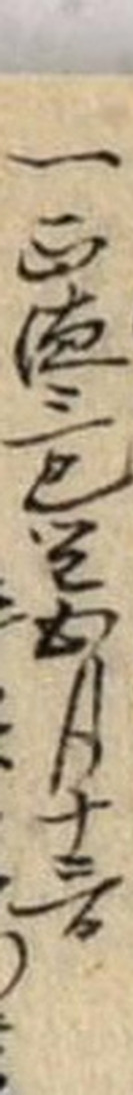一正徳三巳閏五月十三日
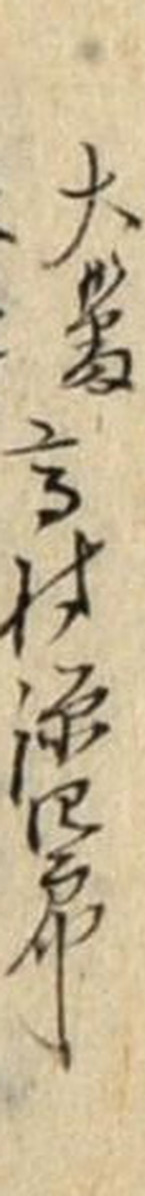大御番高村源四郎
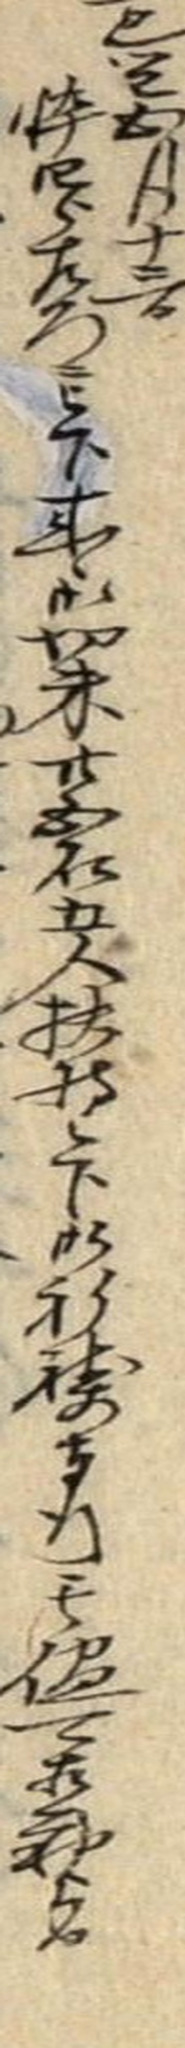忰四郎左衛門に被下来候御切米廿五石五人扶持被下御祈祷奉行其侭可相勤旨
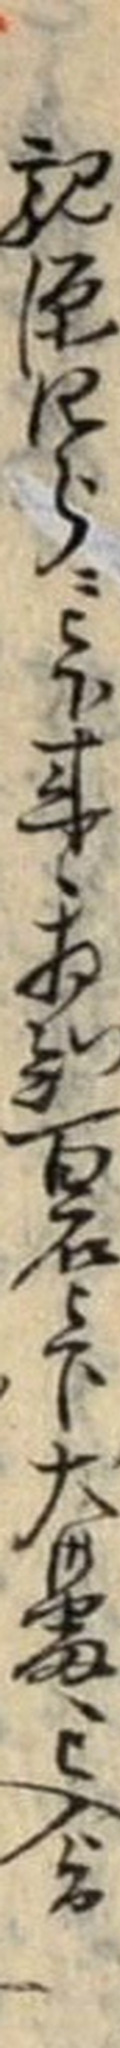親源四郎に被下来候拝知百石被下大御番へ被入旨表御小姓
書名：御用并被仰出之部
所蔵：福井県文書館 Fukui Prefectural Archives
